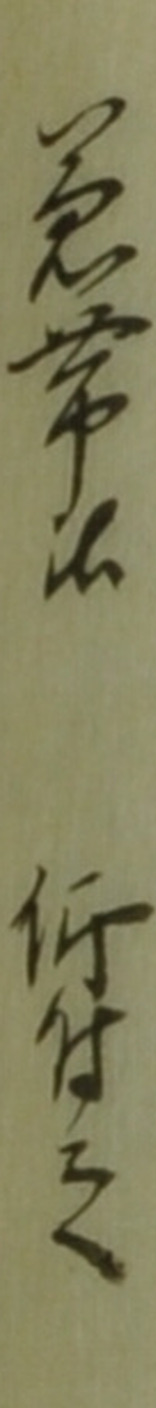兼帯被仰付之
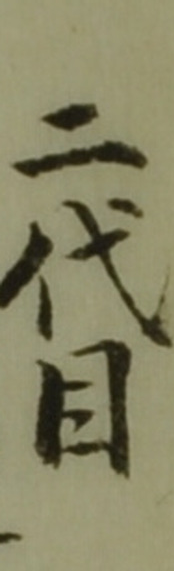二代目
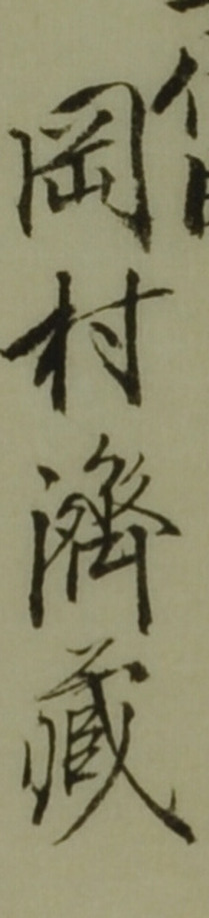岡村瀧蔵
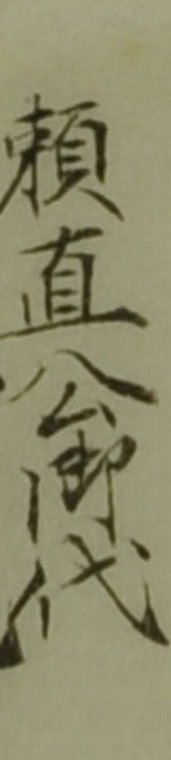頼直公御代
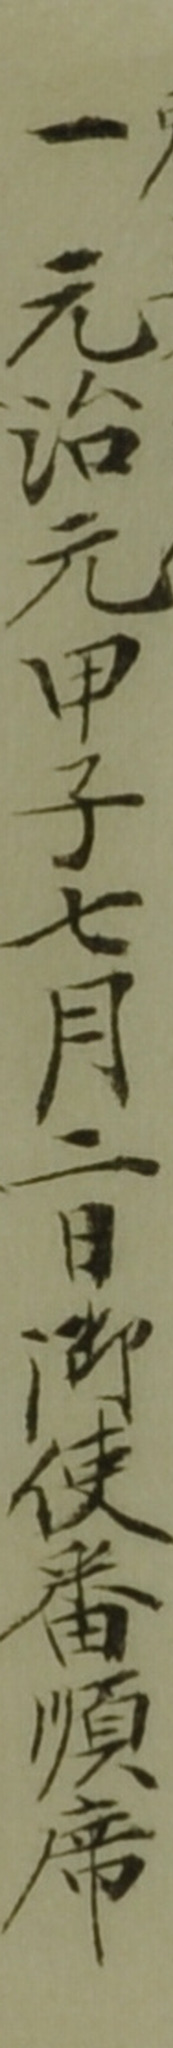一元治元甲子七月二日御使番順席
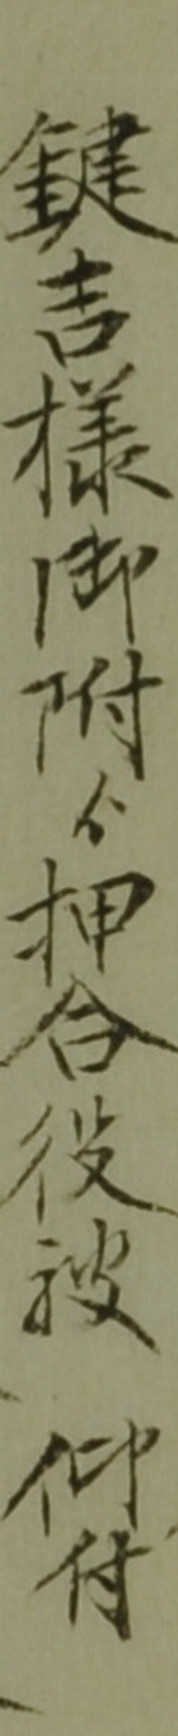鍵吉様御附ゟ押合役被仰付
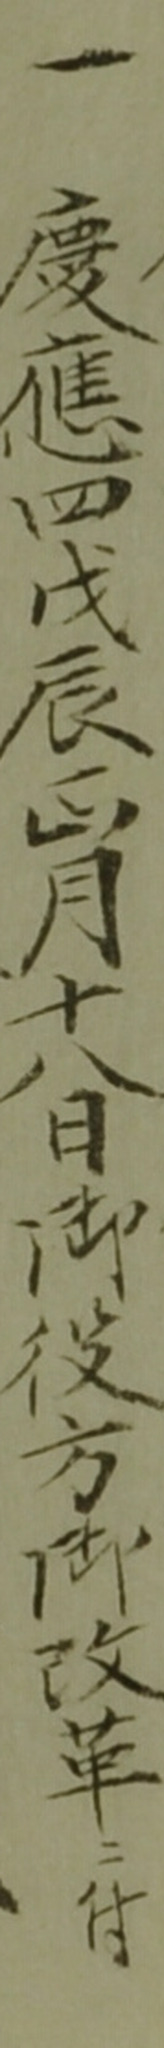一慶応四戊辰正月十八日御役方御改革ニ付
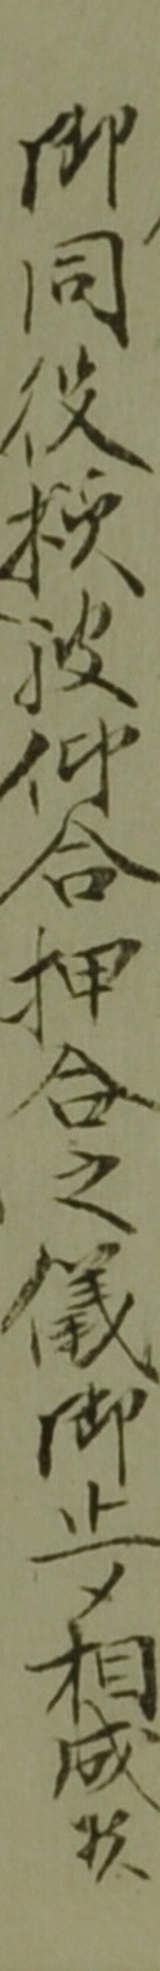御同役様被仰合押合之儀御止メ相成候
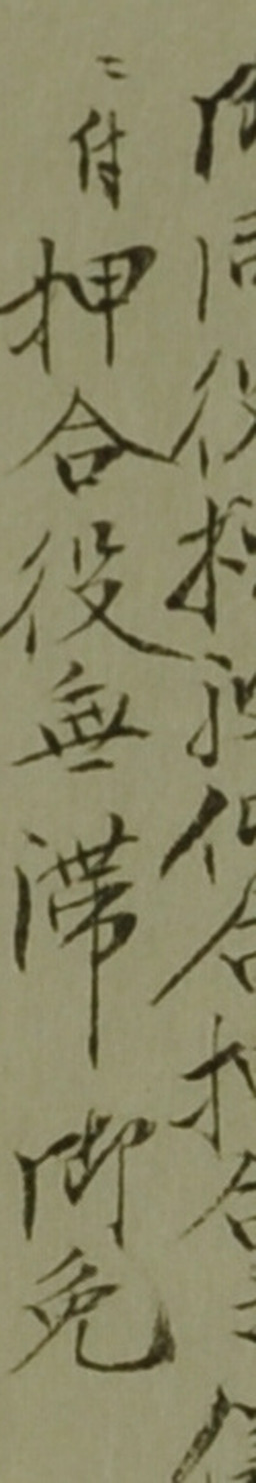ニ付押合役無滞御免
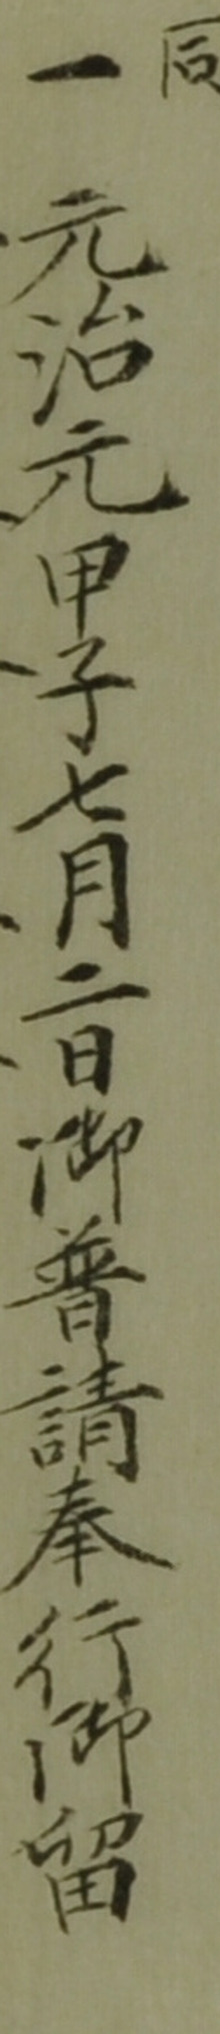一元治元甲子七月二日御普請奉行御留
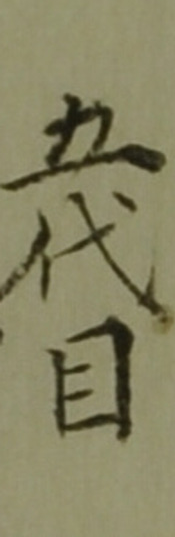五代目
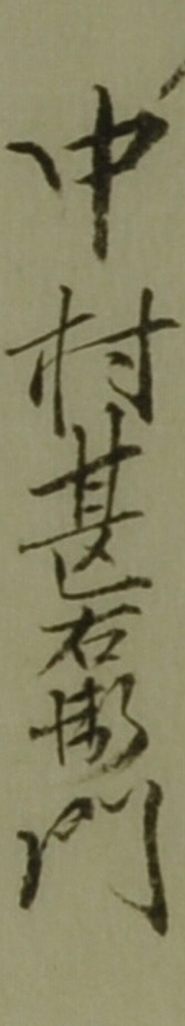中村甚右衛門
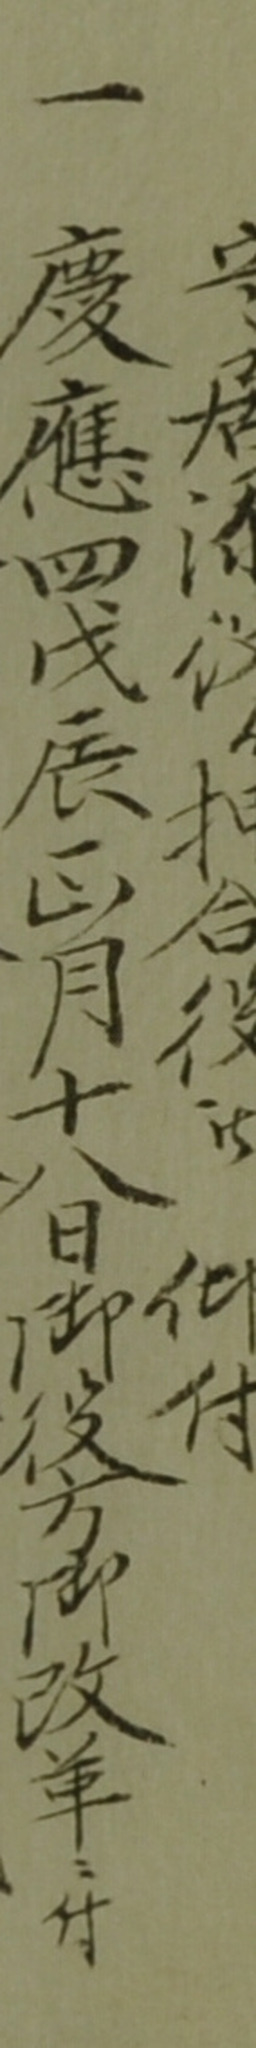一慶応四戊辰正月十八日御役方御改革ニ付
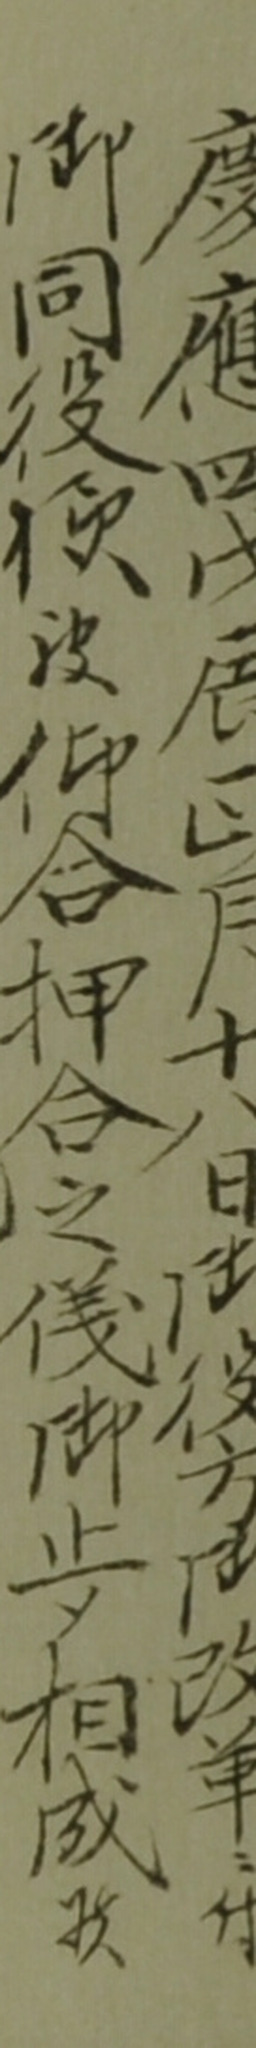御同役様被仰合押合之儀御止メ相成候
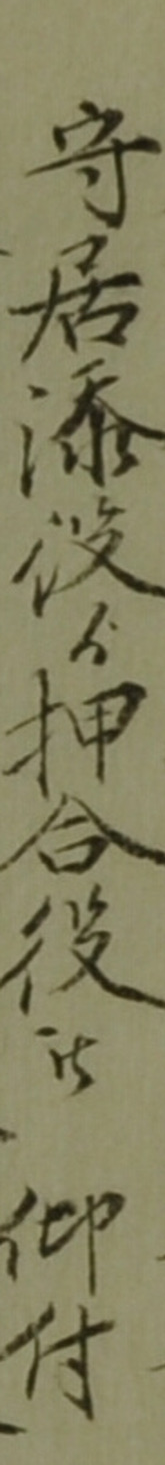守居添役ゟ押合役被仰付
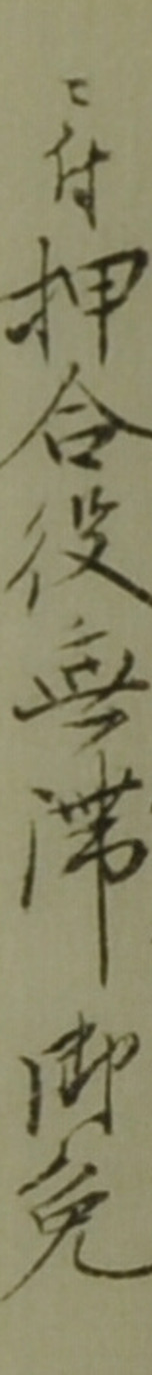ニ付押合役無滞御免
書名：諸御役代々録（七）
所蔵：伊那市立高遠町図書館・合同会社AMANE
